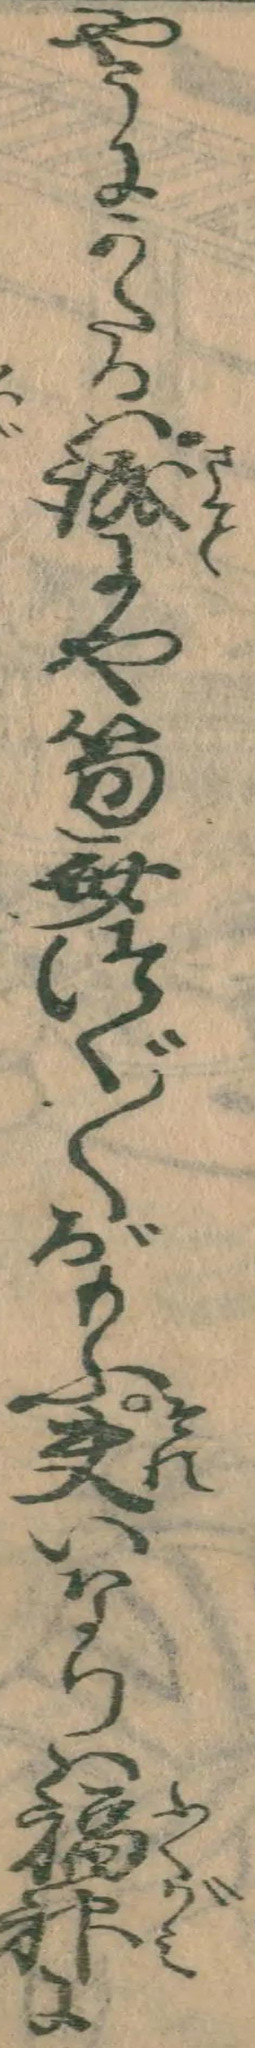やうにかたるは。誠にや筍斎つぐ〳〵おもふ。夫いなりは福神に
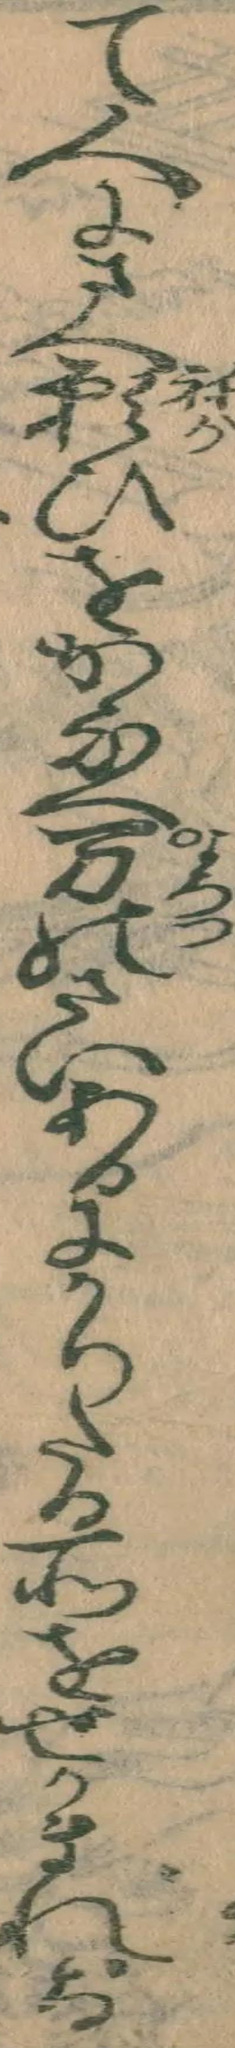て人にさへ願ひをかなへ。万のさいあるにかりたる所をせかまれる
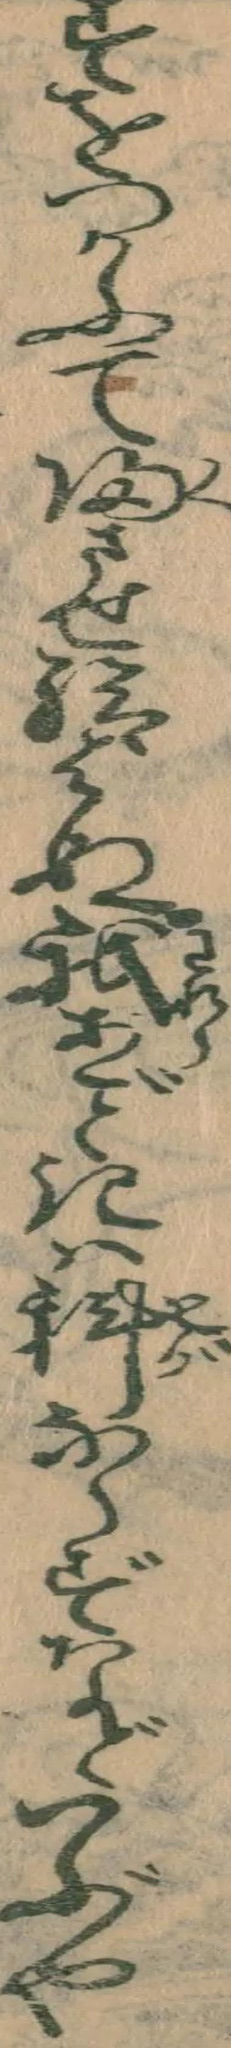すをつかふて帰させ給はぬ。我等ごときは科ならずなどつぶや
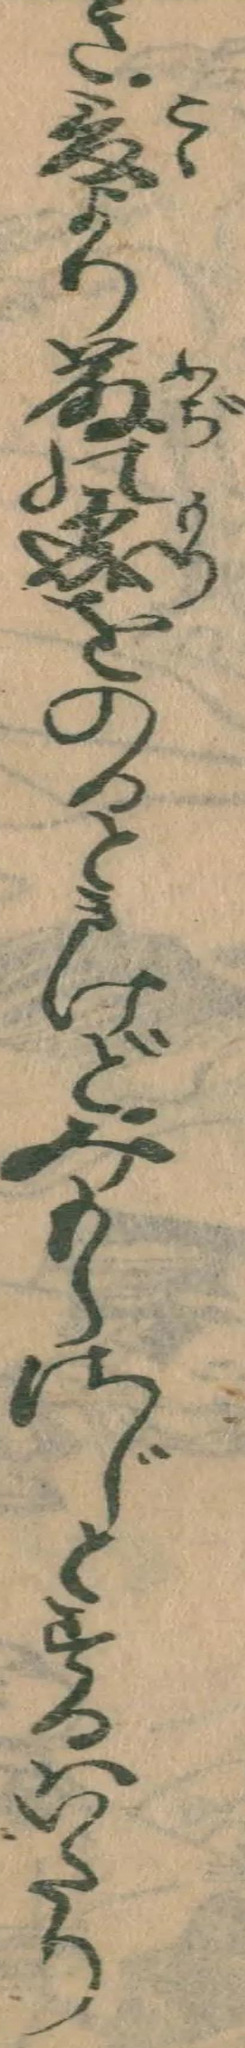き。爰より藤の森をのるときけど。みもらさじとするはいたり
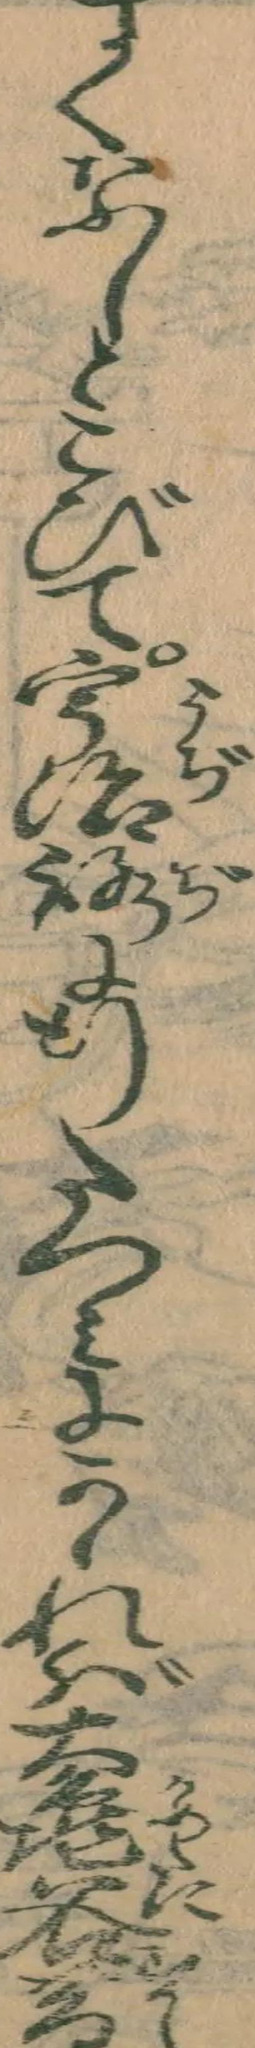すくなしとこびて。宇治路に行たつみにかゝれば大亀谷昔
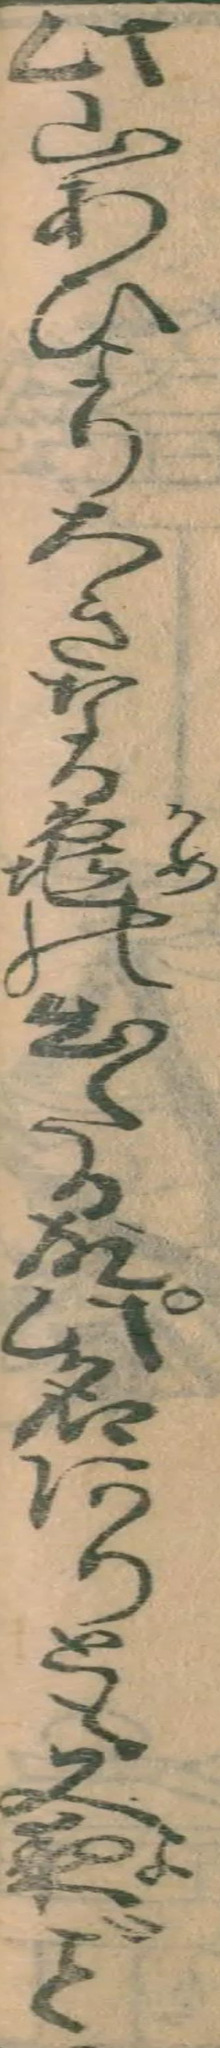此山あひより大きなる亀の出たる故。此名ありとも又夜ごと
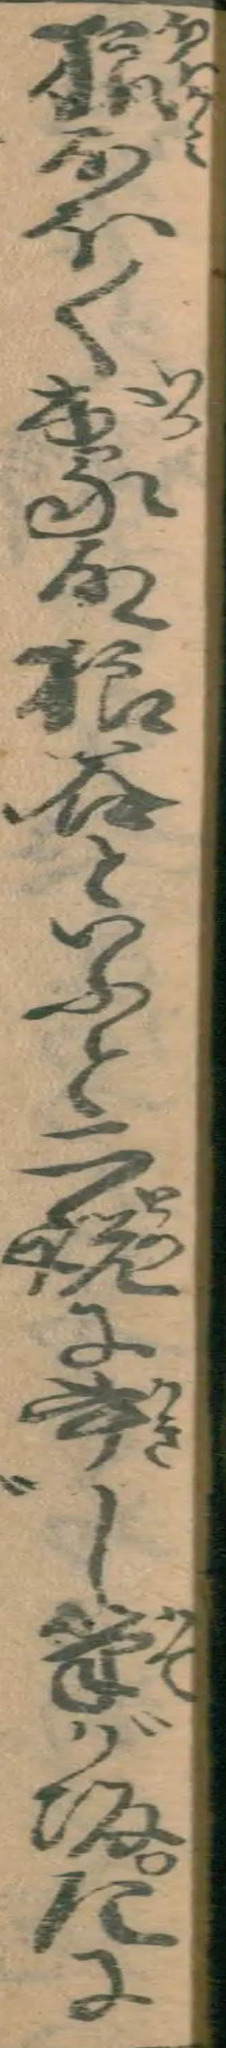狼おほ〱出る故狼谷といふと二説に書し筆が坂。左に
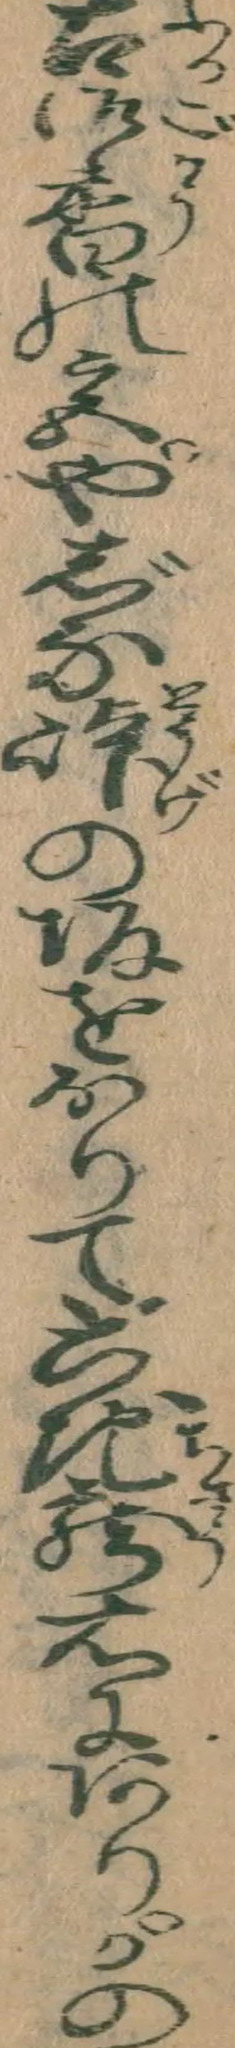古御香の宮。やじな峠の坂をおりて。六地蔵右にあり。かの
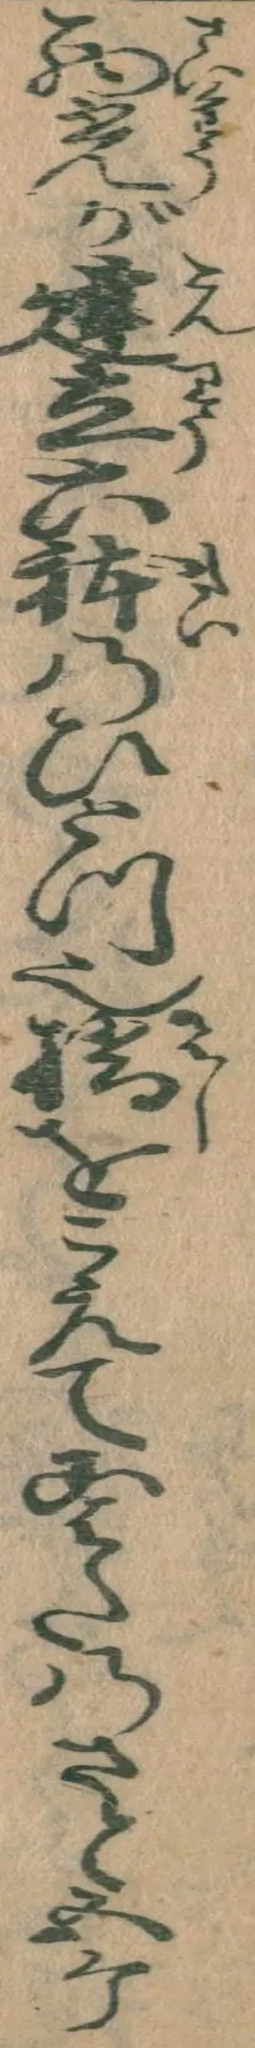西光が建立六体のひとつ也橋をこえて山はたのさと五ケ
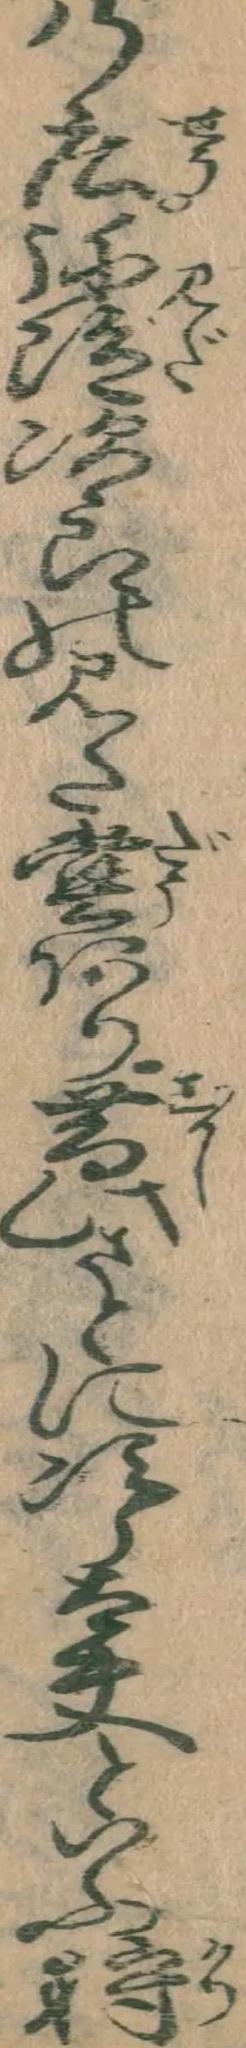の庄。弥陀次郎のみた堂あり。昔此さとに次郎太夫といふ狩
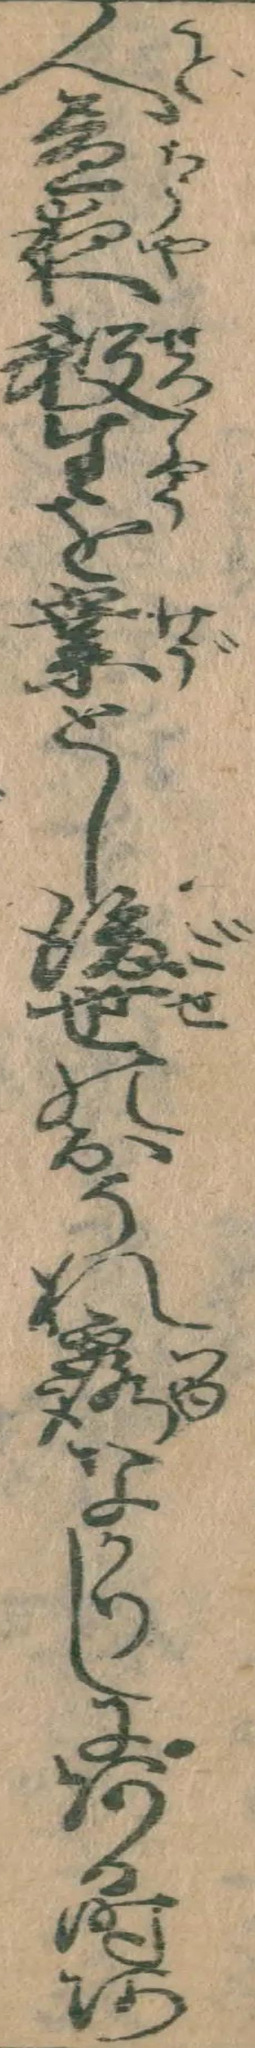人昼夜殺生を業とし後世のおそれ露なかしりに。ある時あ
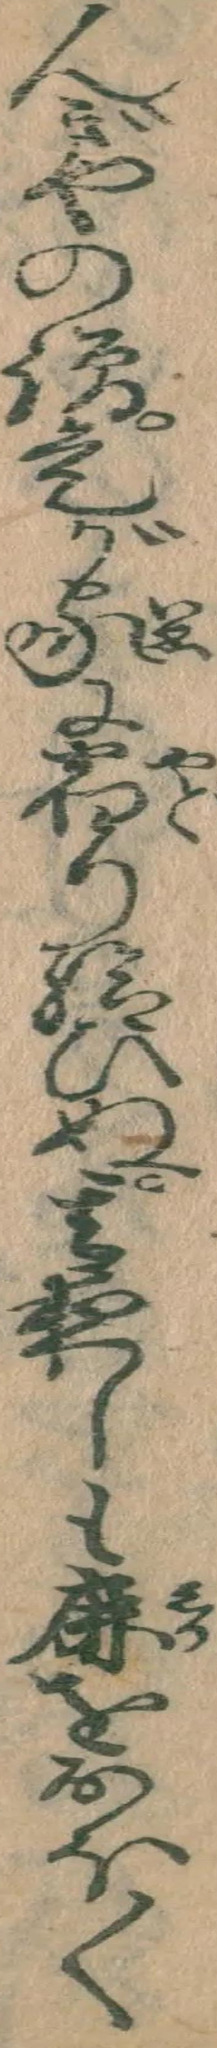んぎやの僧。是が家に宿り給ひぬ。其夜しも鹿をおほく
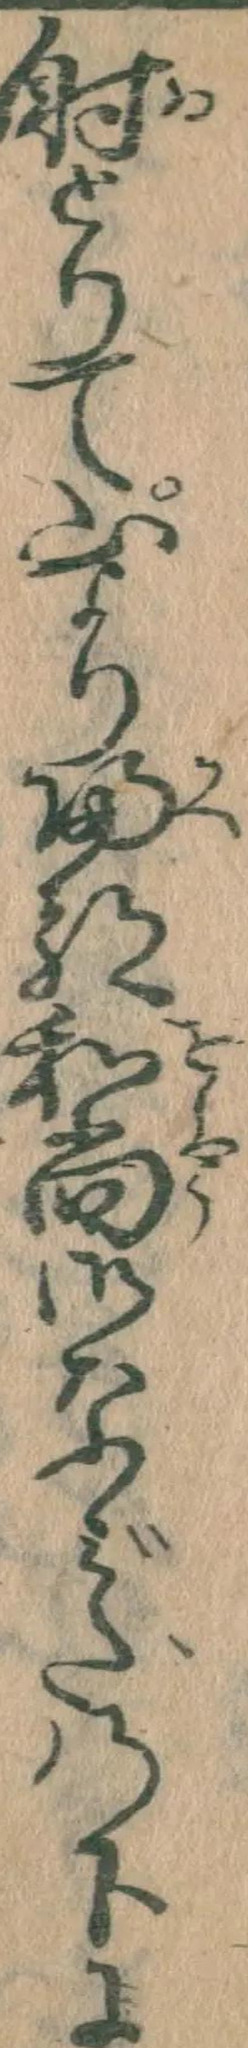射とりて。山より帰る和尚御なみだの下に
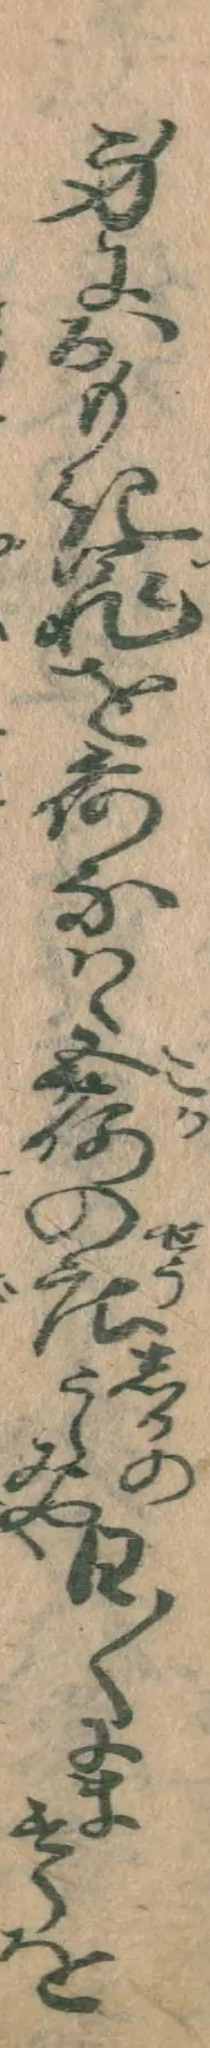身におもき罪を荷なはゝ五荷の庄しかのうらみや日々にますらを
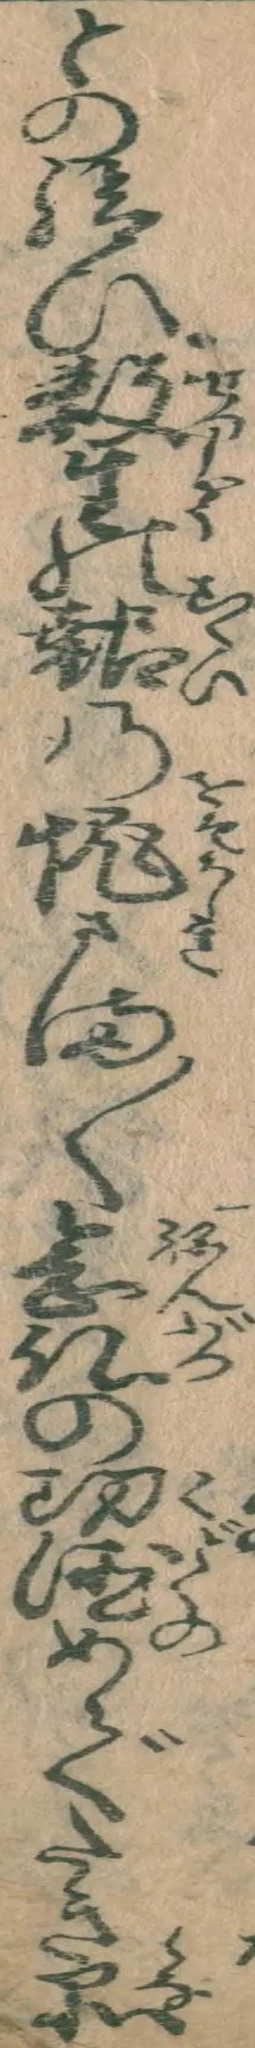との給ひ。殺生の報の恐さま〳〵念仏の功徳めでたき品
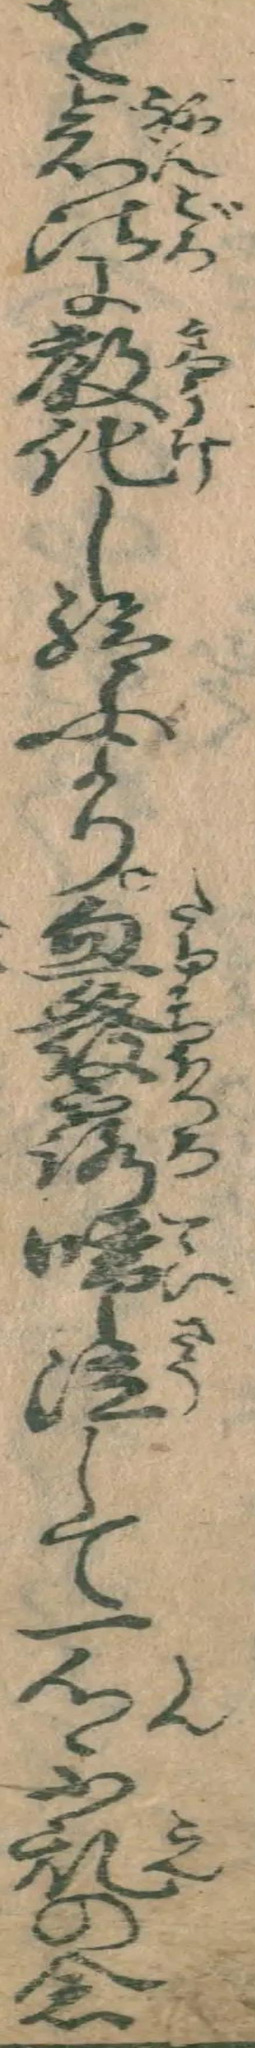を念比に教化し給ふより。忽発露啼泣して一心ふ乱の念
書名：新竹斎 5巻
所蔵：国立国会図書館 National Diet Library, JAPAN
